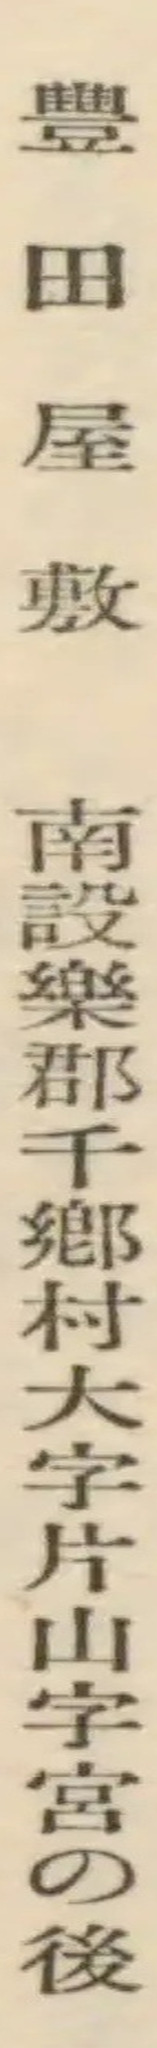豊田屋敷南設楽郡千郷村大字片山字宮の後
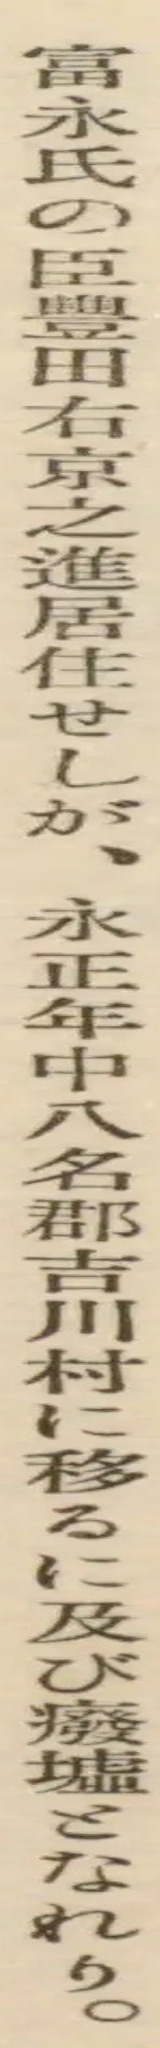富永氏の臣豊田右京之進居住せしが、永正年中八名郡吉川村に移るに及び廃墟となれり。
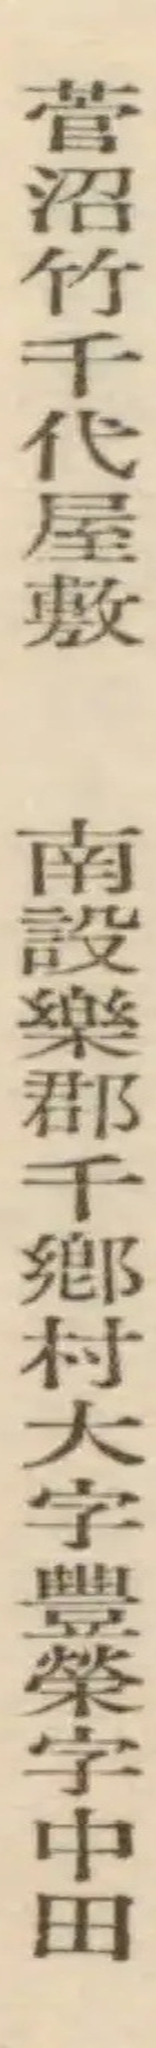菅沼竹千代屋敷南設楽郡千郷村大字豊栄字中田
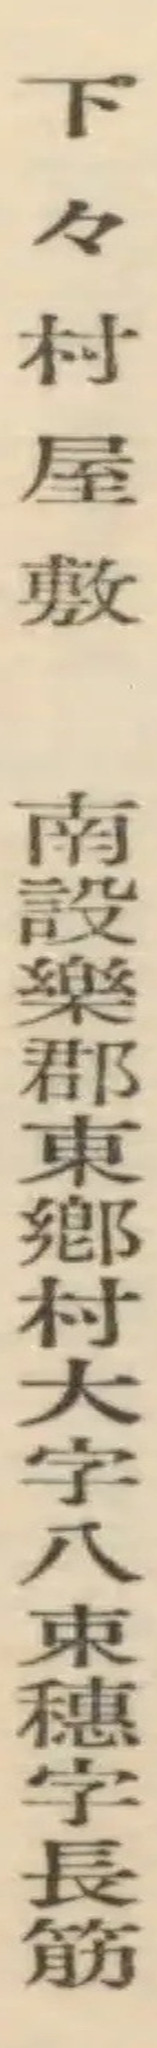下々村屋敷南設楽郡東郷村大字八束穂字長筋
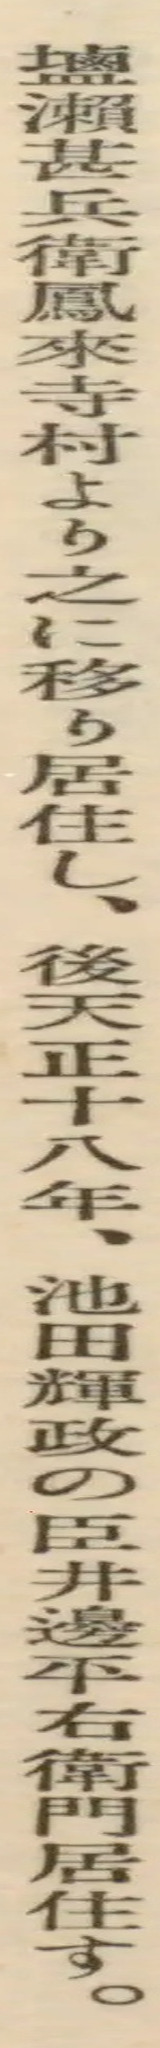塩瀬甚兵衛鳳来寺村より之に移り居住し、後天正十八年、池田輝政の臣井邊平右衛門居住す。
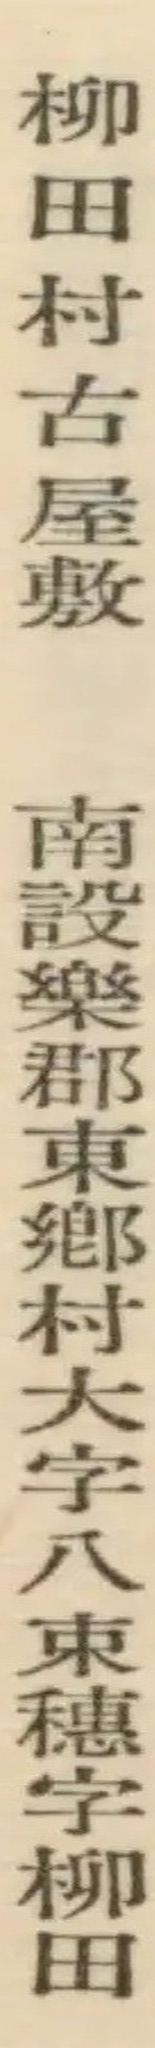柳田村古屋敷南設楽郡東郷村大字八束穂字柳田
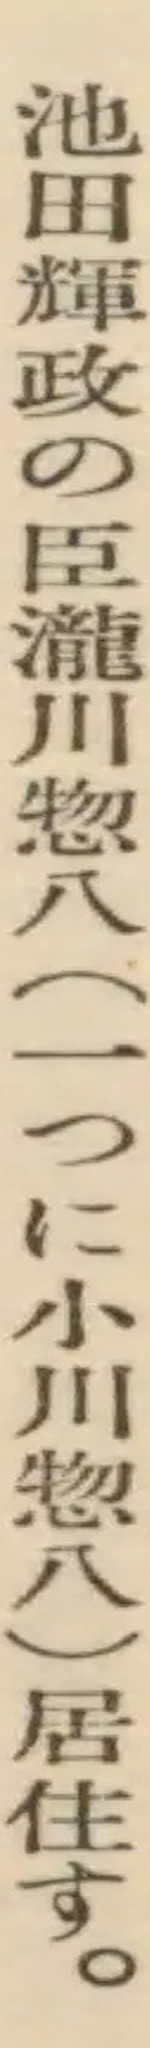池田輝政の臣瀧川惣八(一つに小川惣八)居住す。
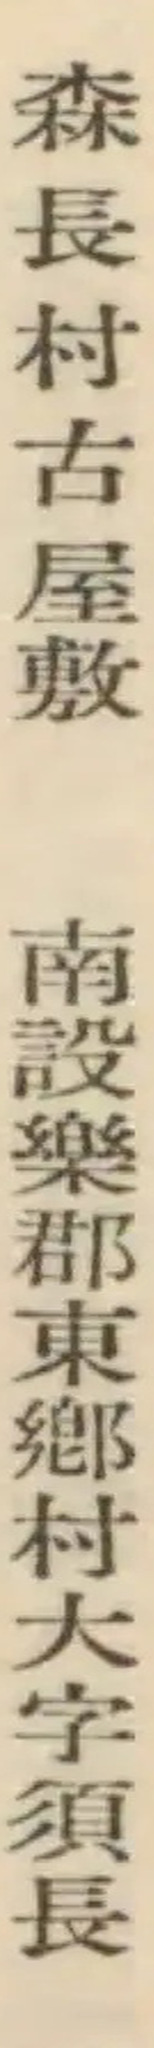森長村古屋敷南設楽郡東郷村大字須長
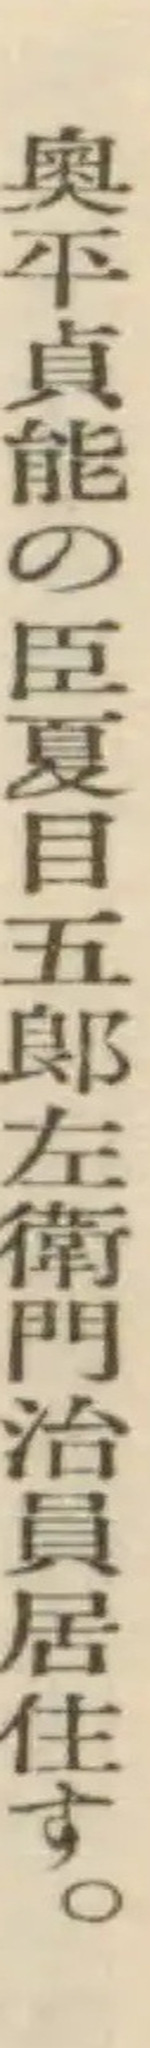奥平貞能の臣夏目五郎左衛門治員居住す。
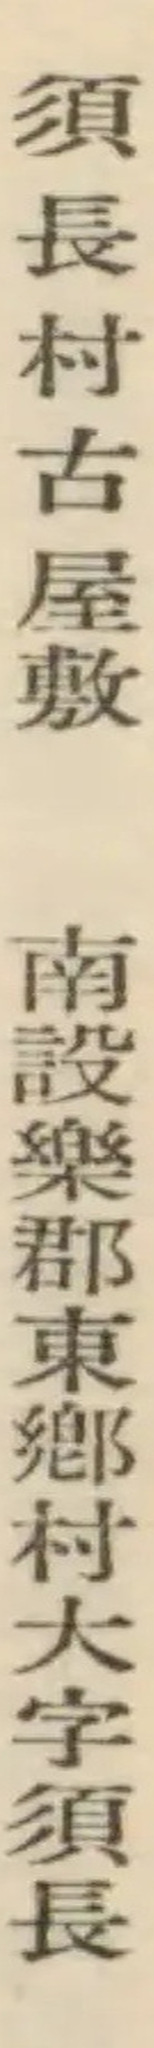須長村古屋敷南設楽郡東郷村大字須長
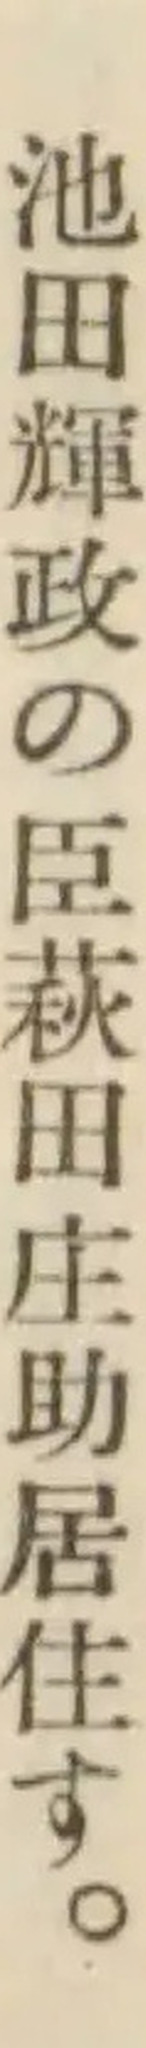池田輝政の臣萩田庄助居住す。
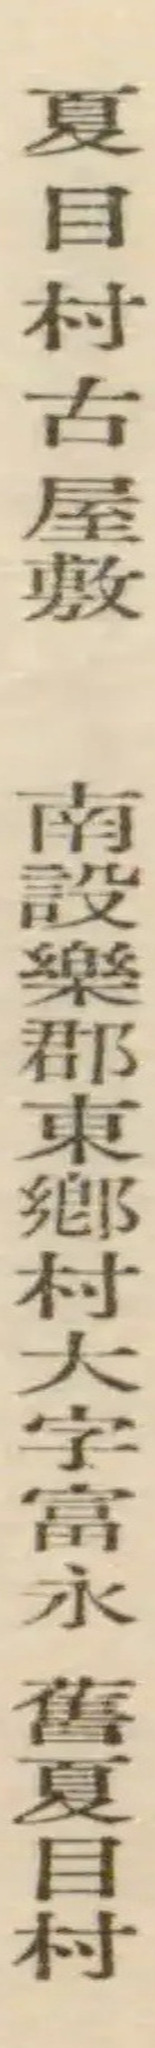夏目村古屋敷南設楽郡東郷村大字富永旧夏目村
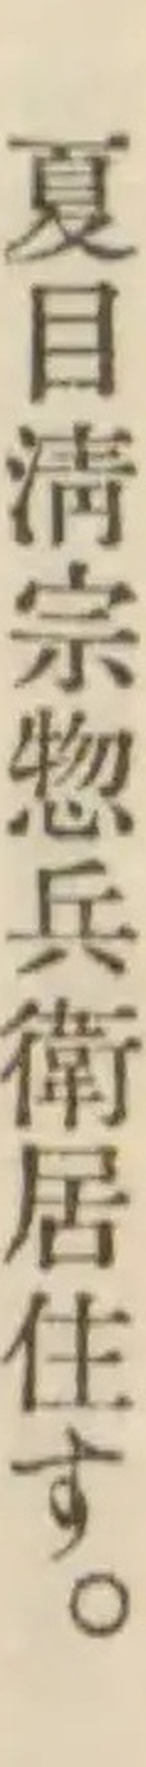夏目清宗惣兵衛居住す。
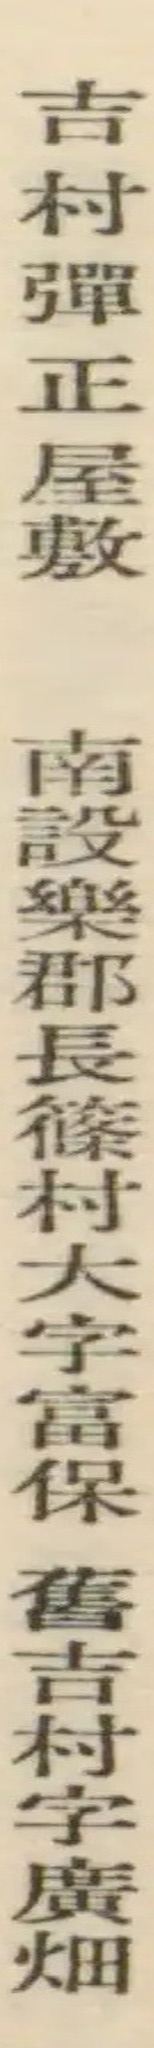吉村弾正屋敷南設楽郡長篠村大字富保旧吉村字廣畑
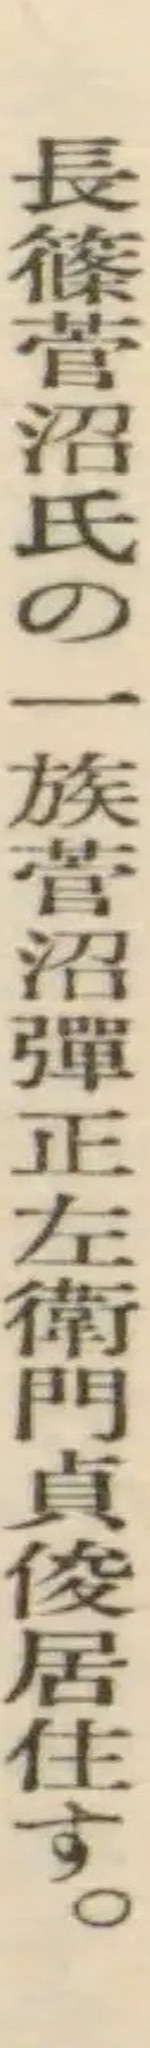長篠菅沼氏の一族菅沼弾正左衛門定俊貞俊居住す。
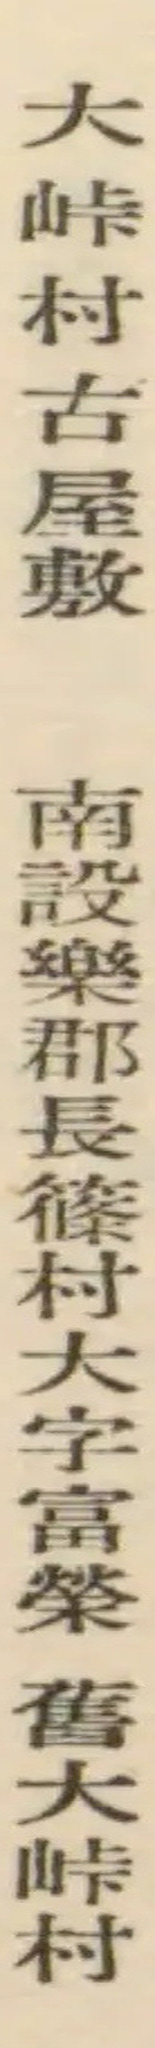大峠村古屋敷南設楽郡長篠村大字富栄旧大峠村
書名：東三河之古城
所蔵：国立国会図書館 National Diet Library, JAPAN
